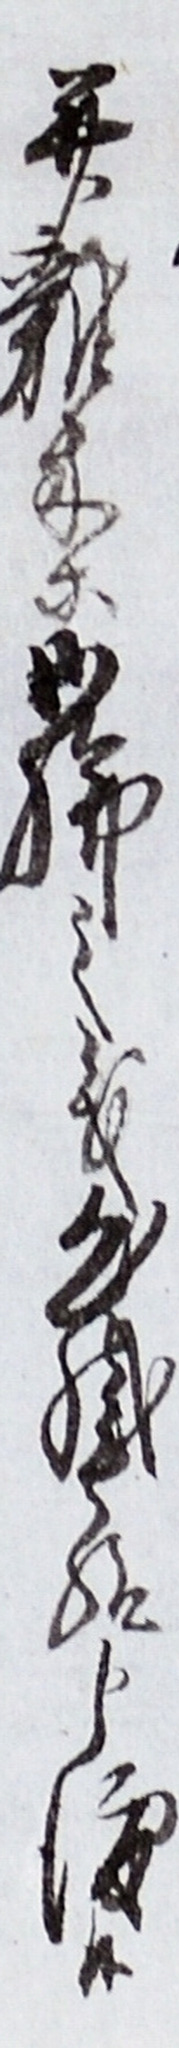并雑木等御締之心掛候様申渡候
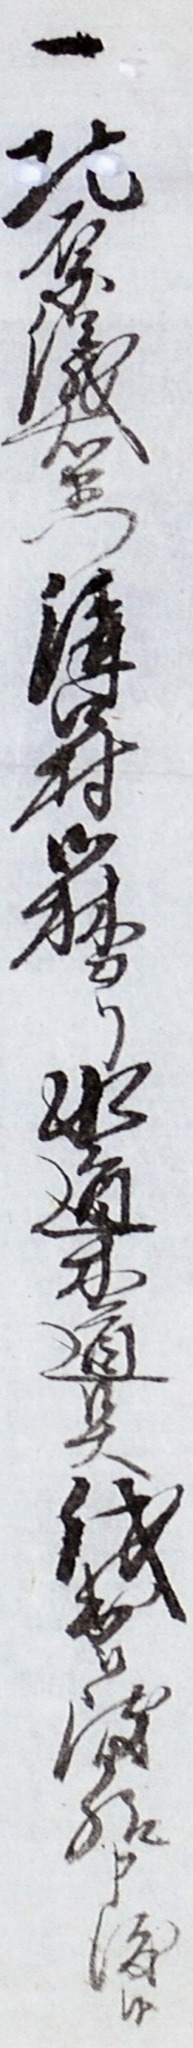一北原儀右衛門溝口村御林より水道来通足伐出来様申渡候
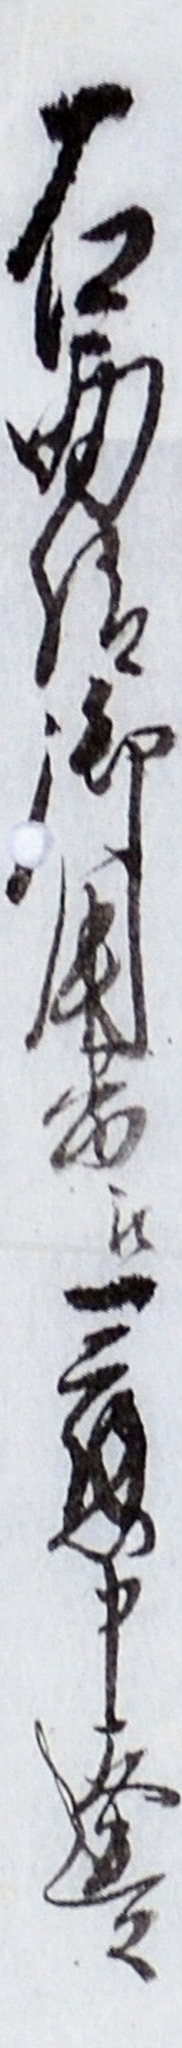右面請御用番え一応申達ス
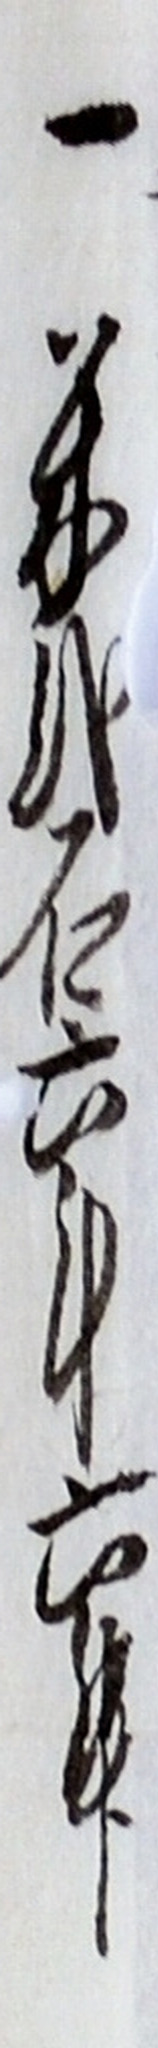一米弐石六斗六升
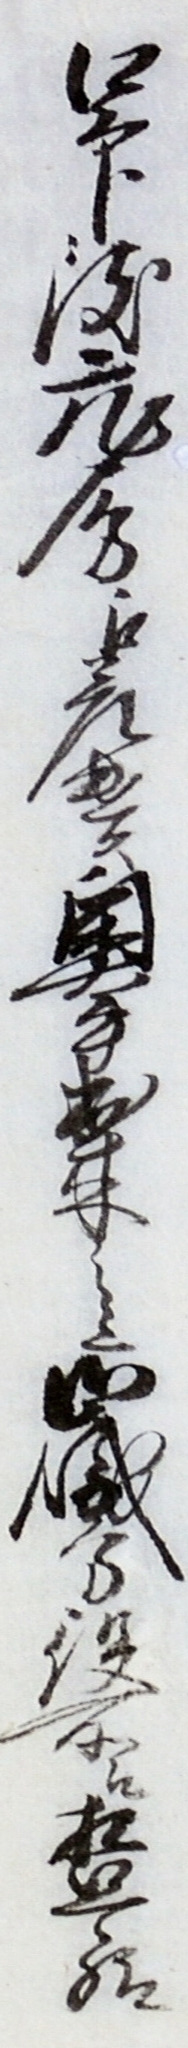四五郎致老方江差遣候奥方出来之御職分役所江相廻候様
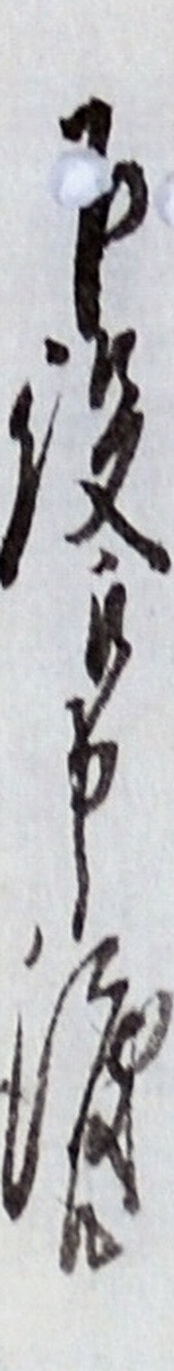下役被申渡候
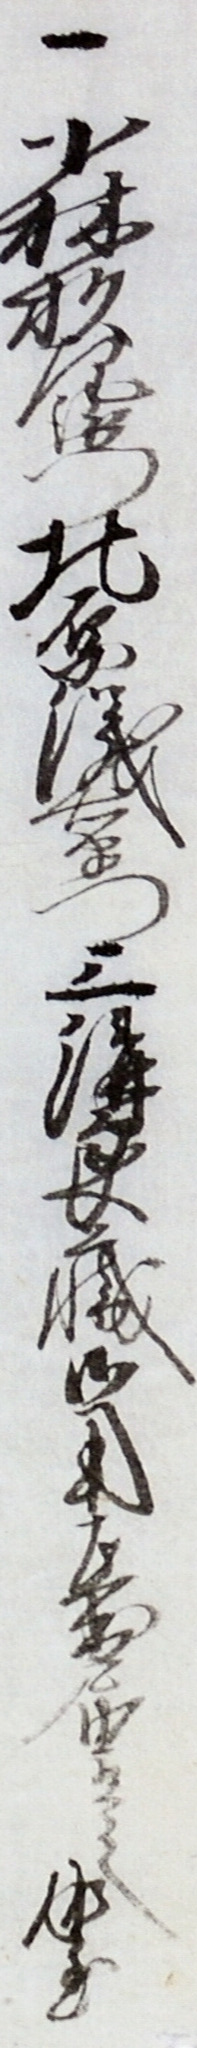一小林杉左衛門北原浅儀右衛門三溝良蔵御用番届有之候承置
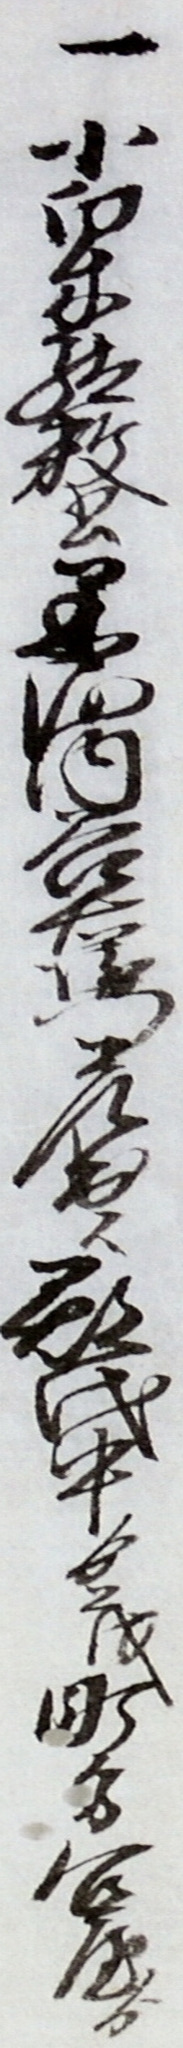一小白木打数共黒河内善右衛門差出ス郡代中より町方問屋より
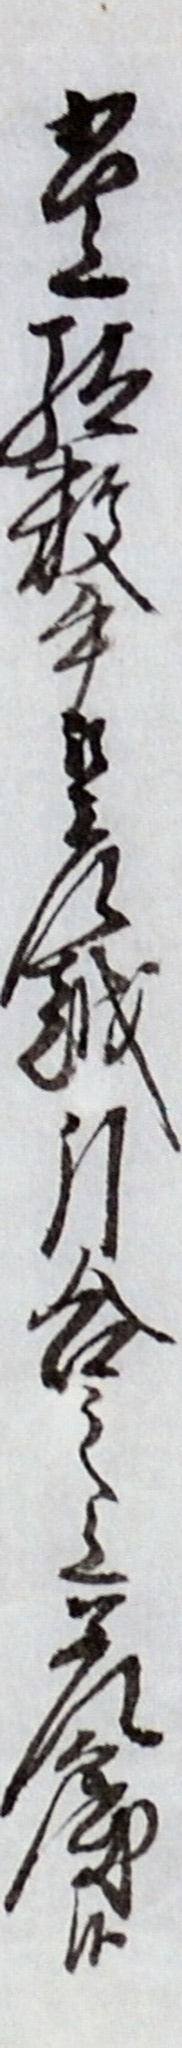上駄数年御差越引合之上差戻候
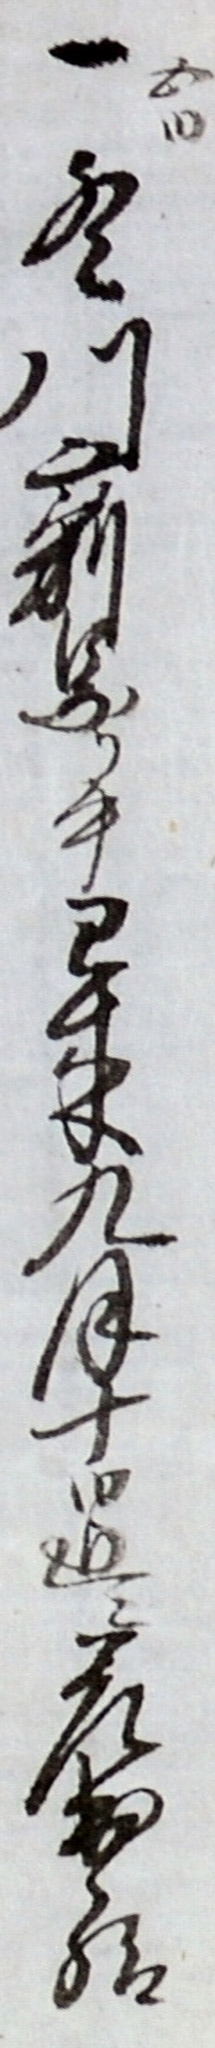一川薪図り中已年九月十日迄ニ差出候様
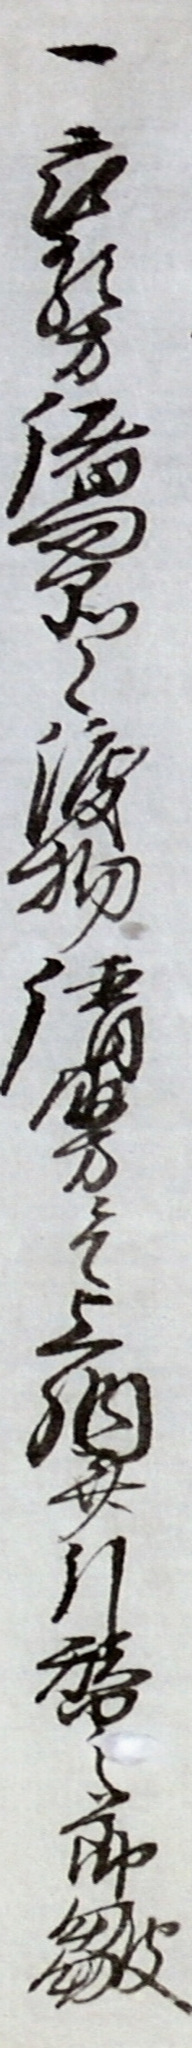一衣類方諸向品々渡物の請取方ニて上納并引替之節皺
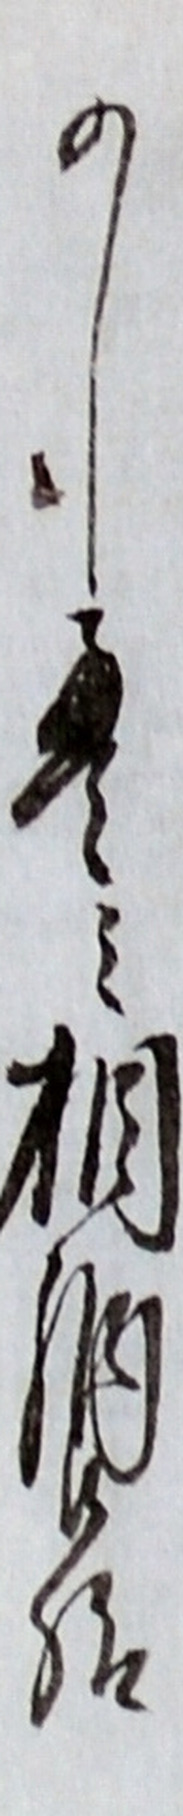のし畳み相納候様

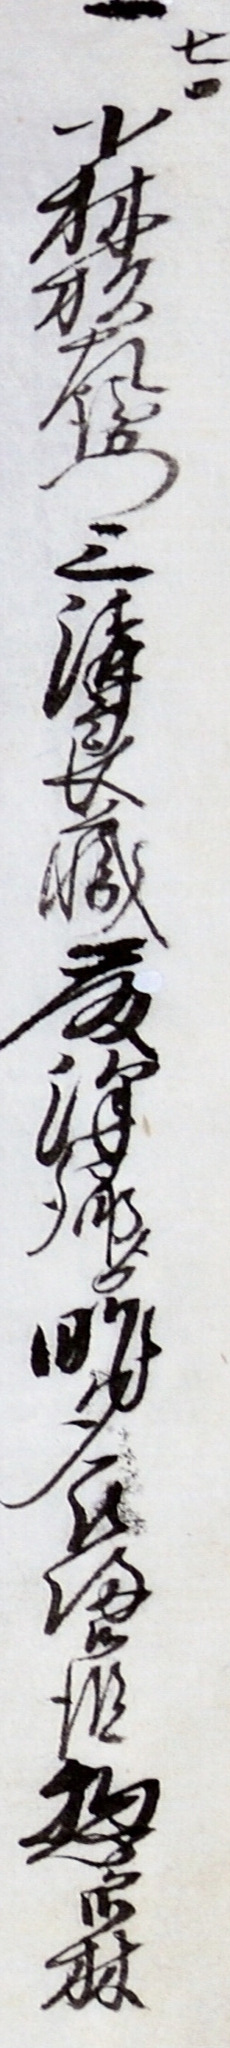一小林杉左衛門三溝良蔵藤沢郷より昨夕罷帰候惣而御林
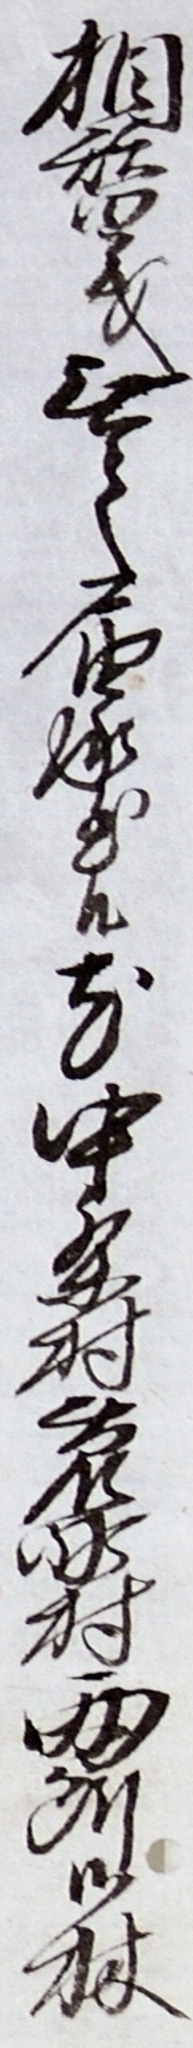相替義無之届承置候尤中条村村両所御林
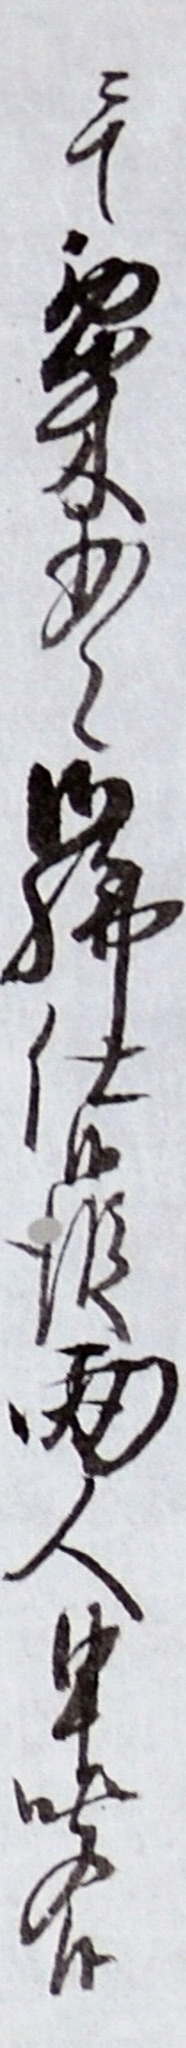ニて栗木少々御払仕候段両人申聞候
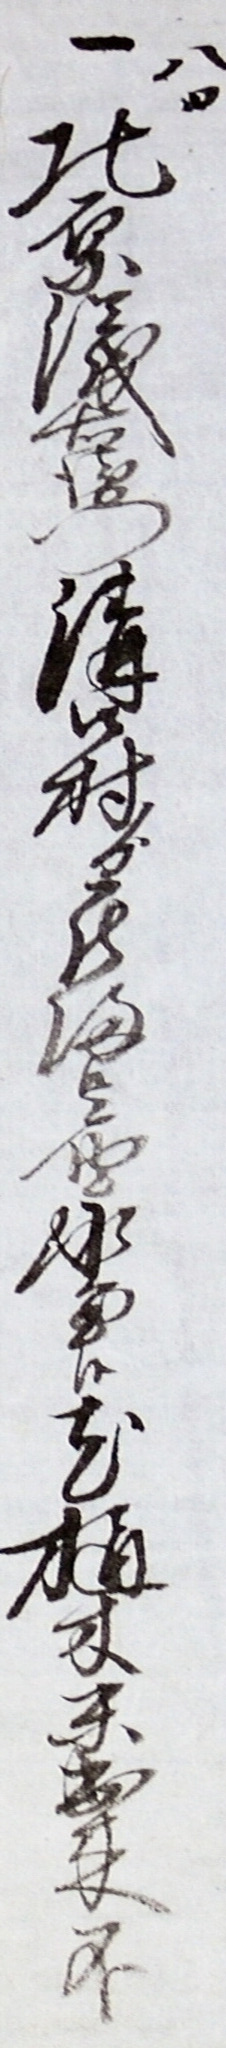一北原儀右衛門溝口村より罷帰与届承置候尤樋木未出来不
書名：御山奉行御用控
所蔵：伊那市立高遠町図書館・合同会社AMANE
